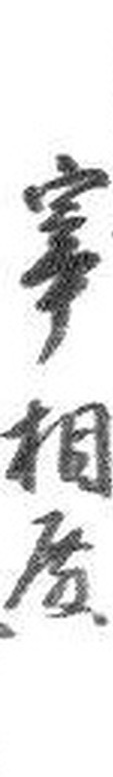宰相殿
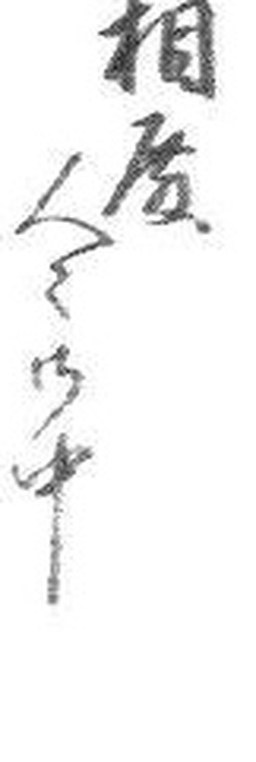人々御中
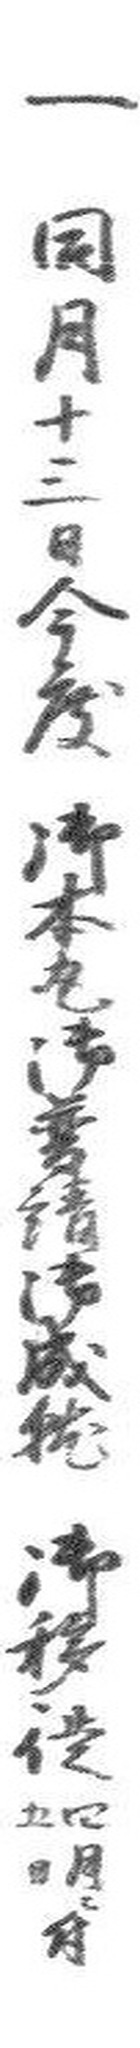一同月十三日今度御本丸御普請御成就御移徙四月五日ニ付
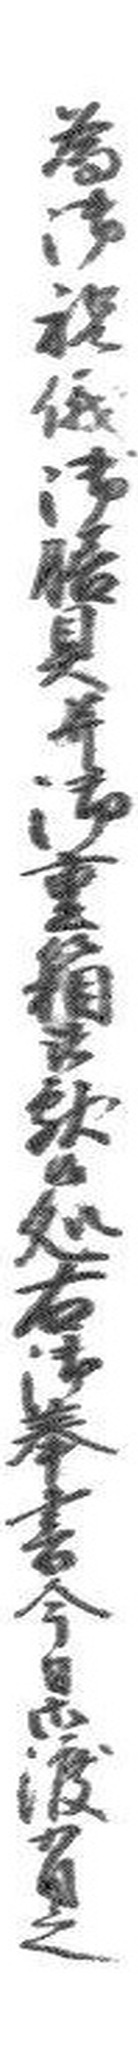為御祝儀御膳具并御重箱被献候処右御奉書今日御渡有之

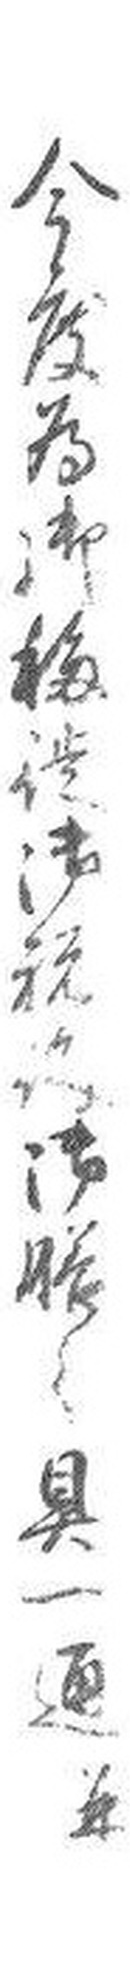今度為御移徙御祝儀御膳之具一通并
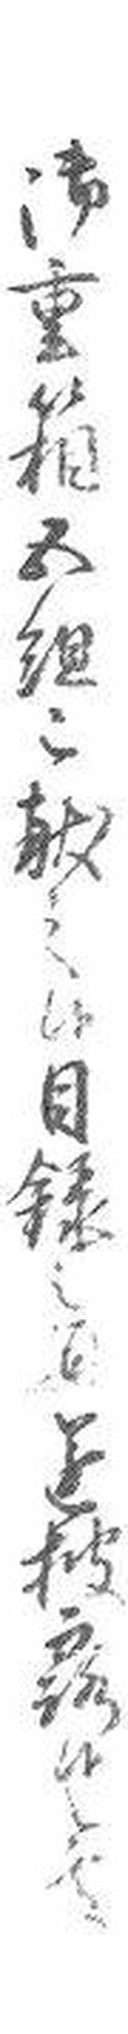御重箱五組被献之候目録之通遂披露候之処
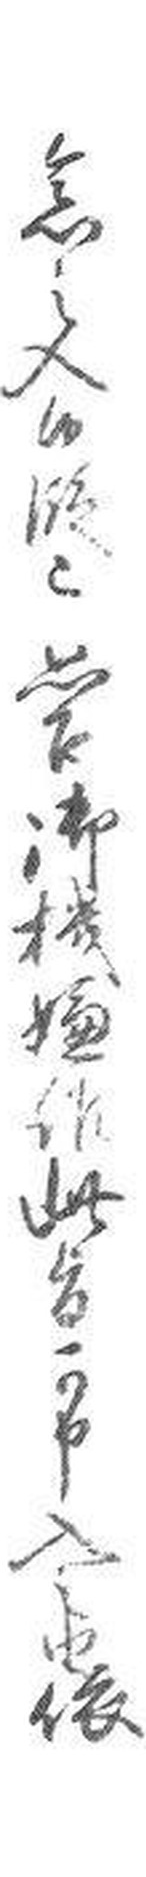念之入候段被思召御機嫌候此旨可申入之由依
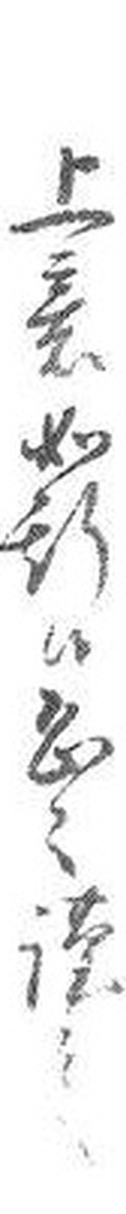上意如斯候恐々謹言
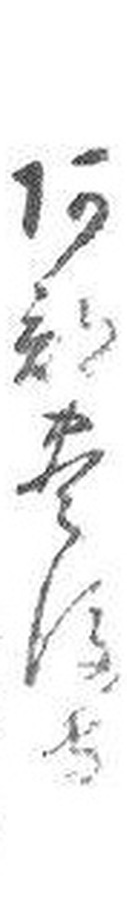阿部豊後守
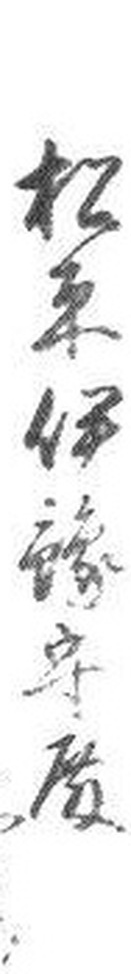松平伊予守殿
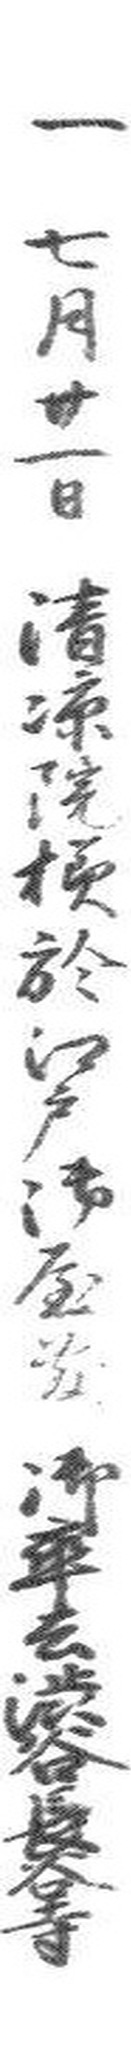一七月廿一日清涼院様於江戸御屋敷御卒去渋谷長谷寺
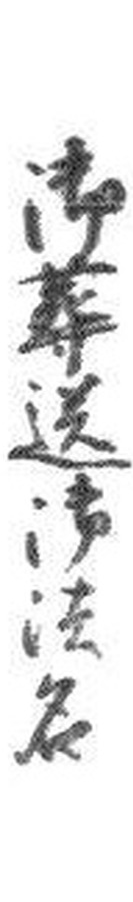御葬送御法名
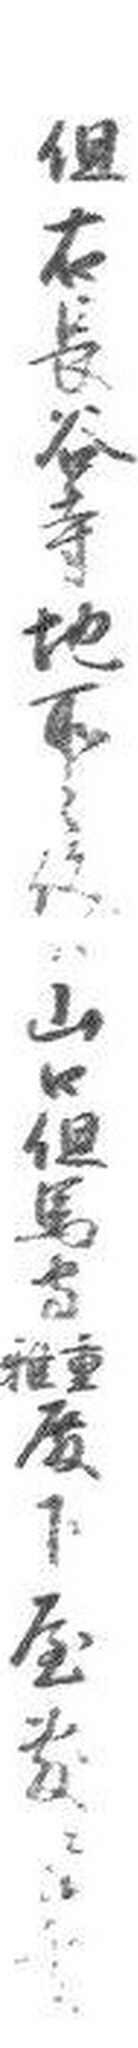但右長谷寺地所之儀ハ山口但馬守重雅殿下屋敷ニ候処
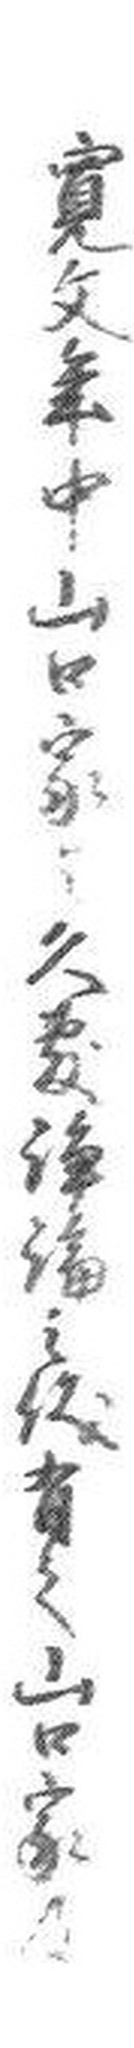寛文年中山口家と久敷諍論之儀有之山口家及
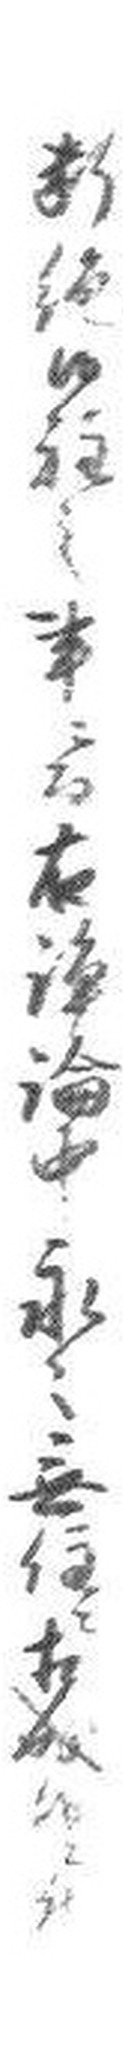断絶候程之事ニ而右諍論中永々無住ニ相成候ニ付
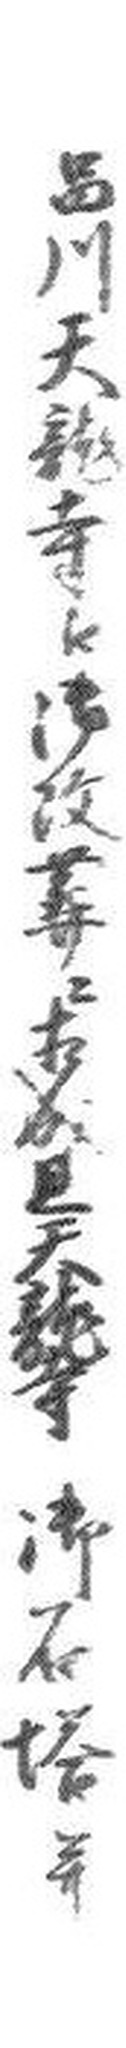品川天龍寺江御改葬ニ相成且天龍寺御石塔并
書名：家譜 四 忠昌公 従寛永七年到正保四年
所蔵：福井県文書館 Fukui Prefectural Archives
